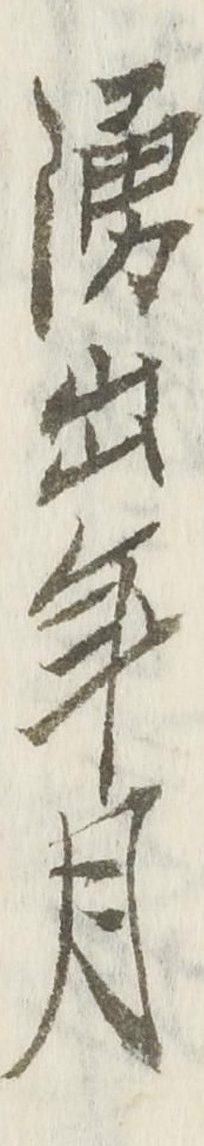湧出年月
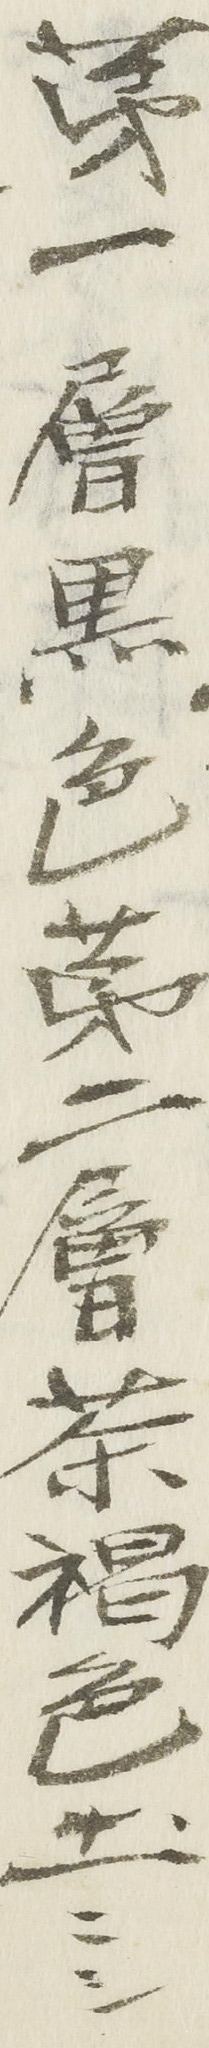第一層黒色第二層茶褐色土ニシ
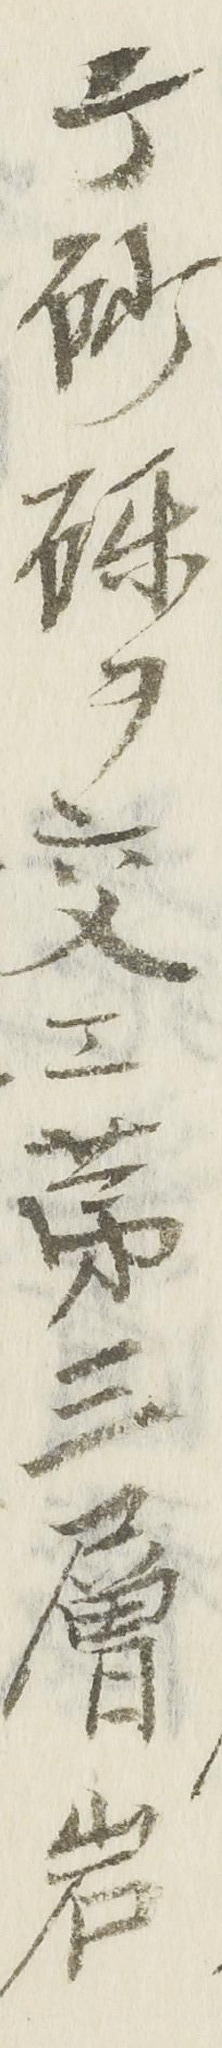テ砂礫ヲ交エ第三層岩
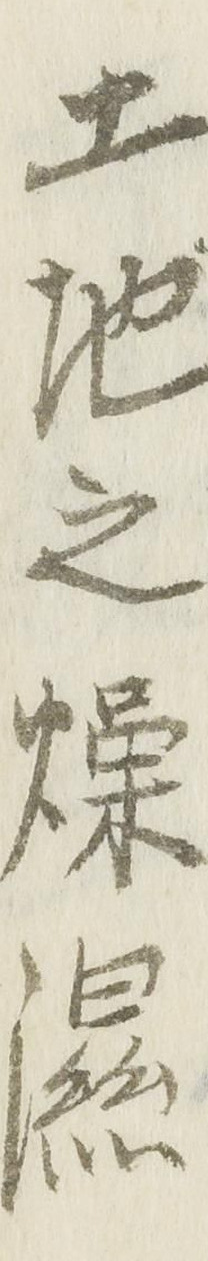土地之燥湿

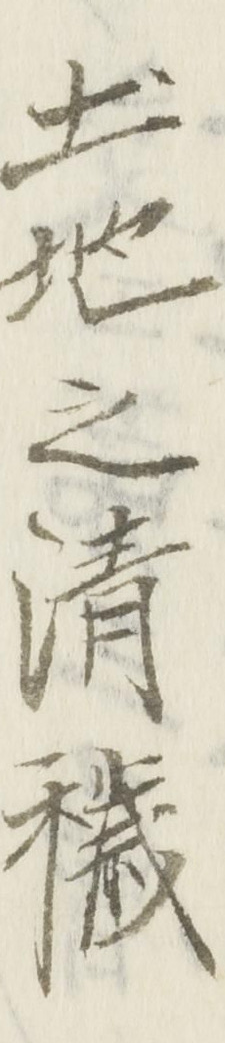土地之清穢
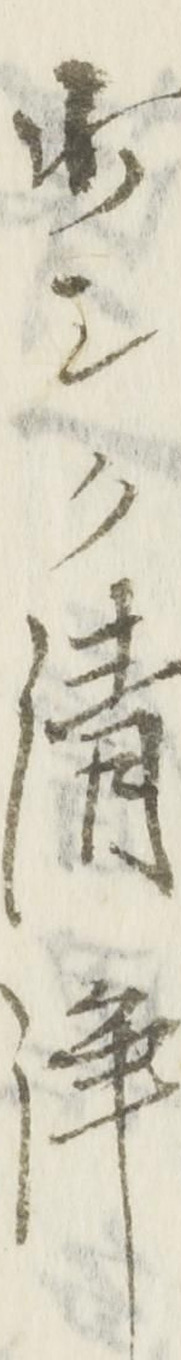少シク清浄
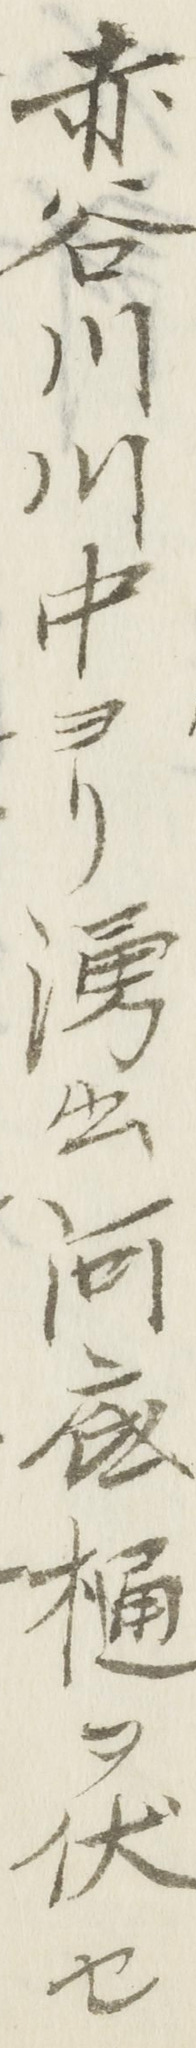赤谷川川中ヨリ湧出河底樋ヲ布セ
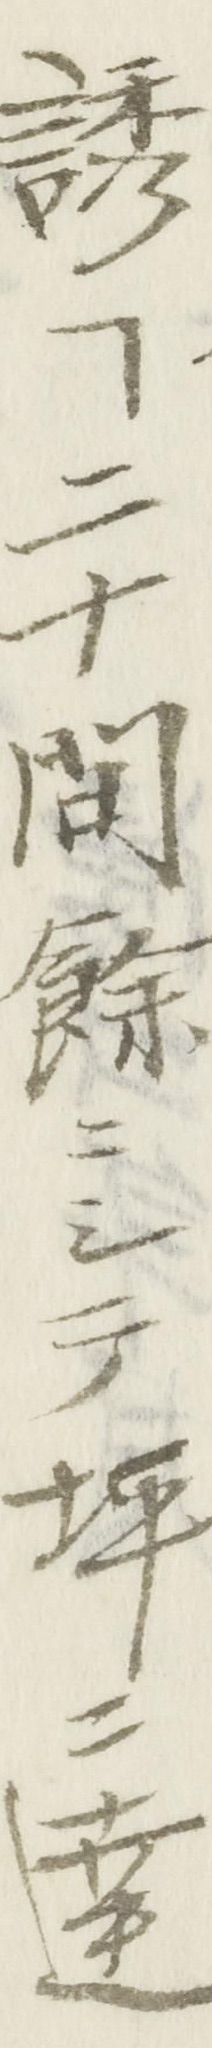誘に二十間餘ニシテ坪ニ達さん
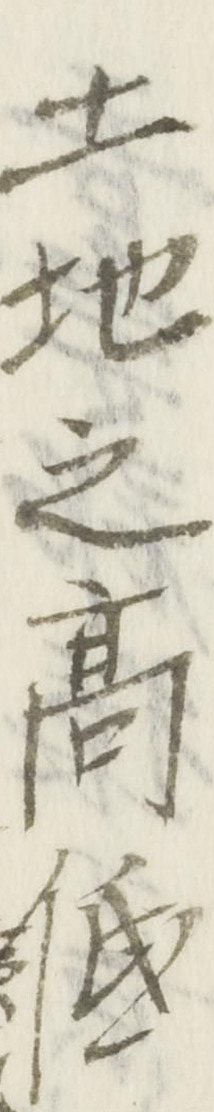土地の高低
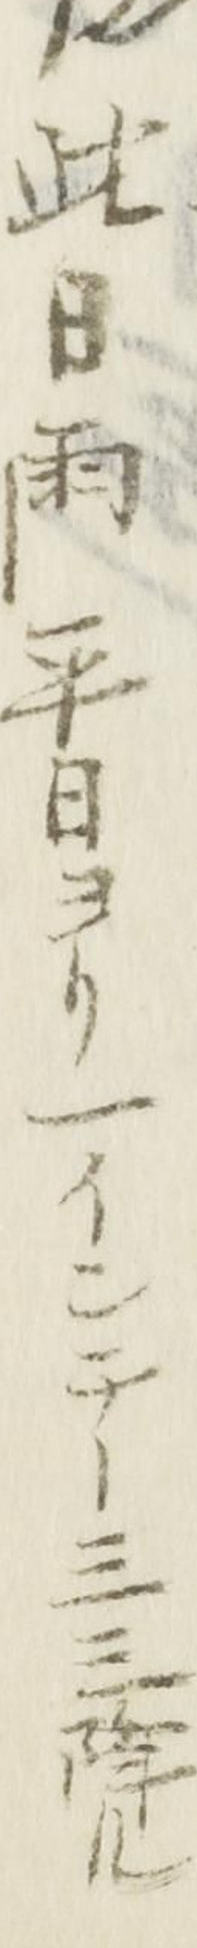此日雨平日ヨリ一インチ―三三降ル
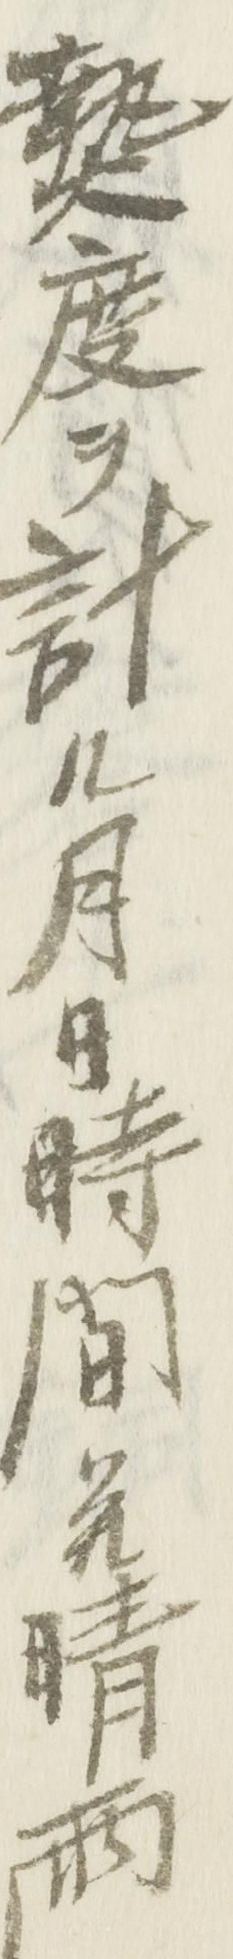熱度ヲ計ル月日時間并晴雨
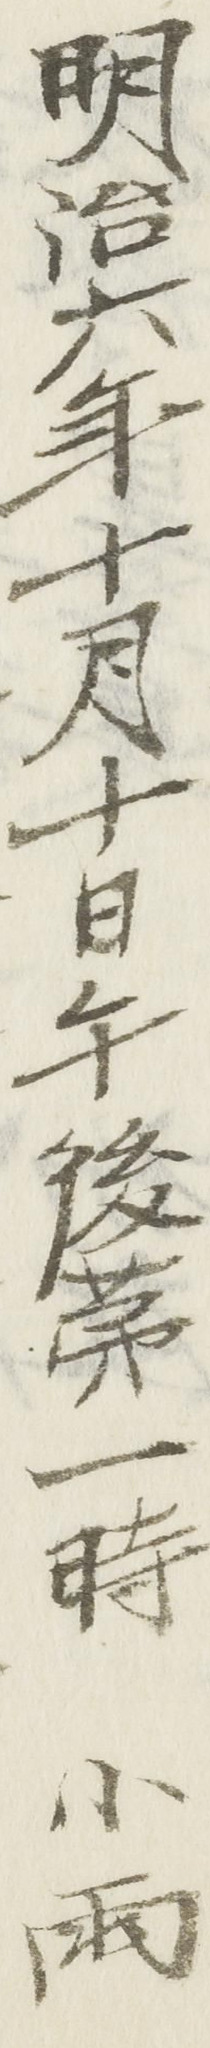明治六年十月十日午後第一時小雨
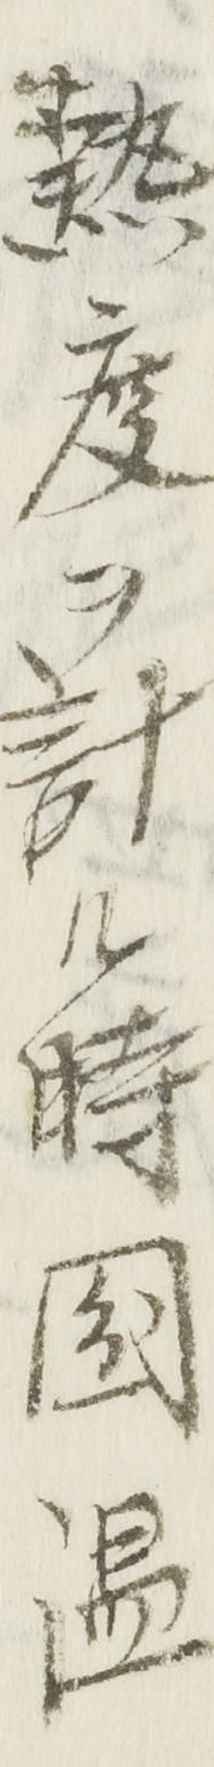熱度ヲ計ル時分温
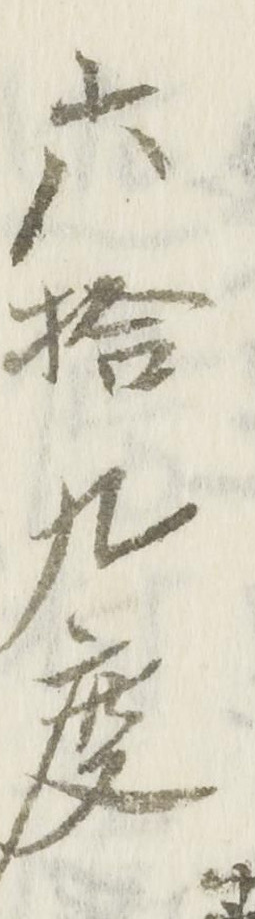六拾九度
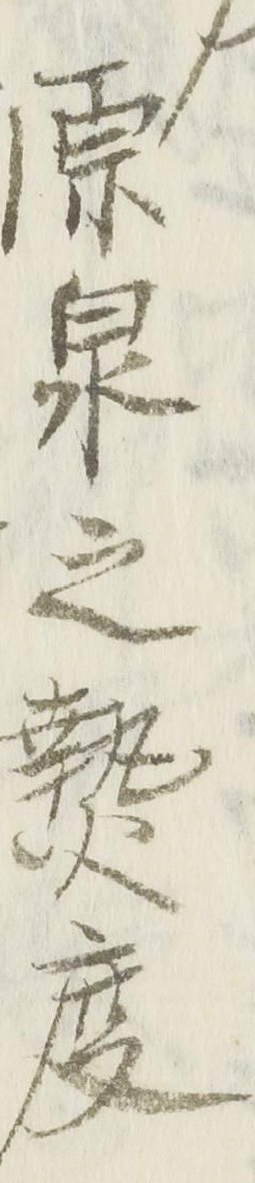原泉之熱度
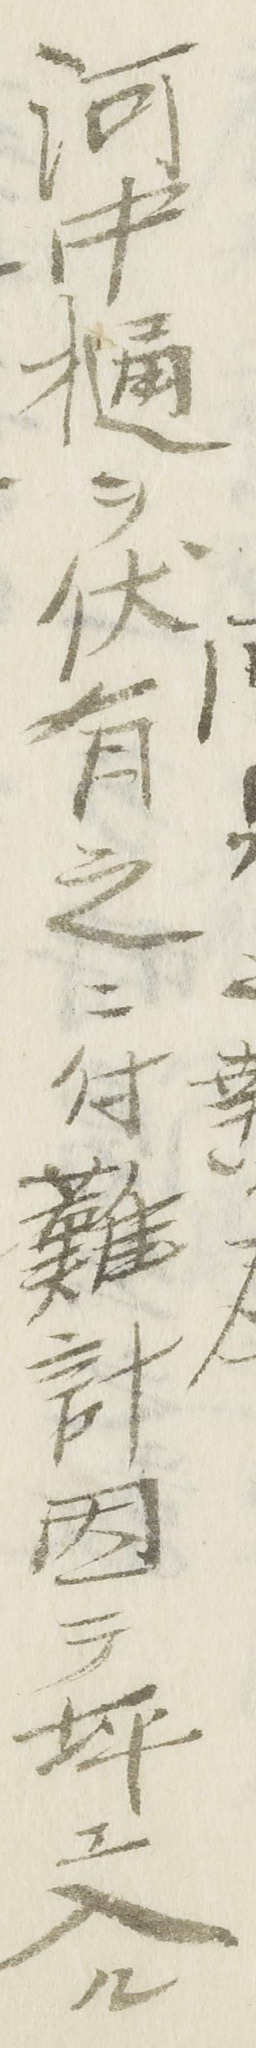河中樋ヲ伏有之ニ付難計因ヲ坪エ入ル
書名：温冷泉試験表
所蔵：東京大学地震研究所図書室 Earthquake Research Institute Library, The University of Tokyo, JAPAN
